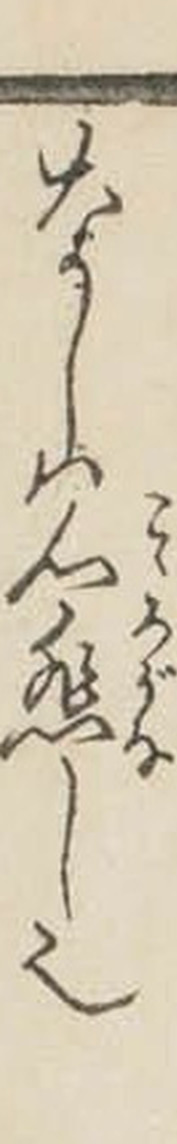なしは心悲し也
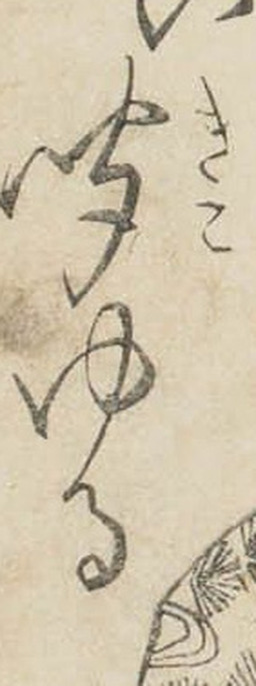聞ゆる

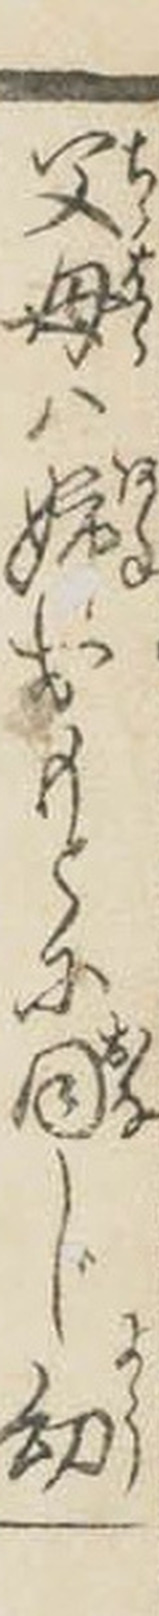父母は姉おもとに同じ幼
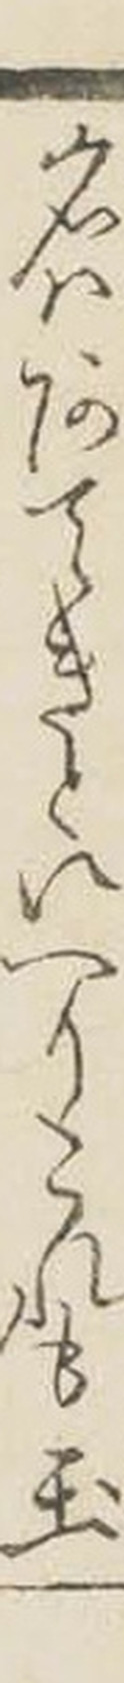名はあてきといへりこれも玉
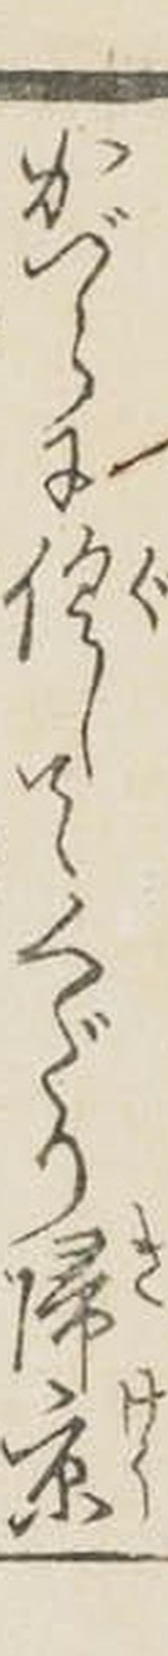かづらに倶してくだり帰京
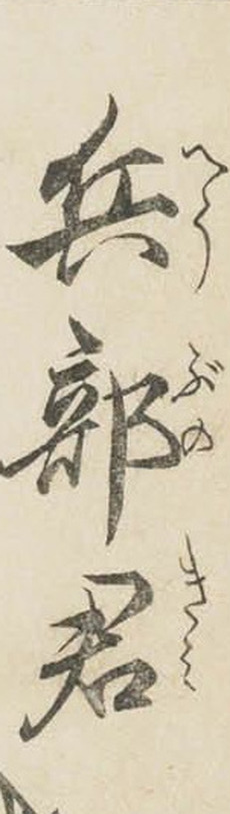兵部君
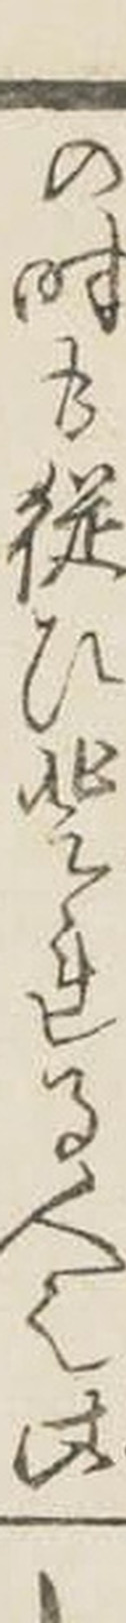の時も従ひ登れる人也此
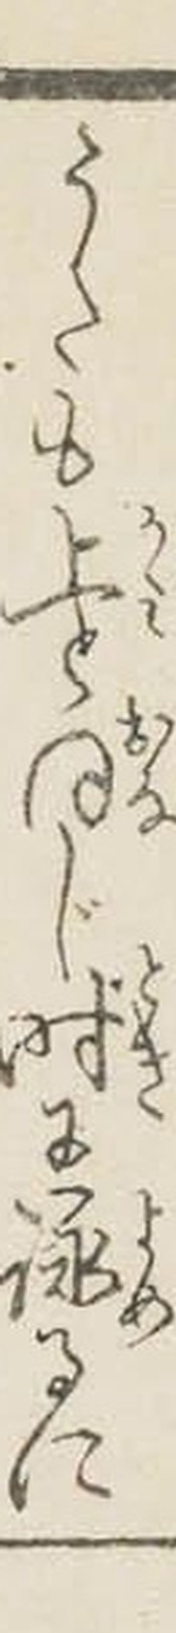うたも上と同じ時に詠るに
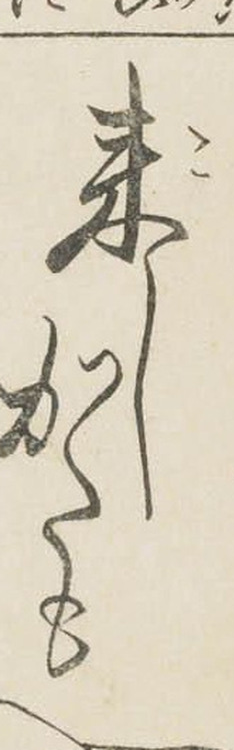来しかたも
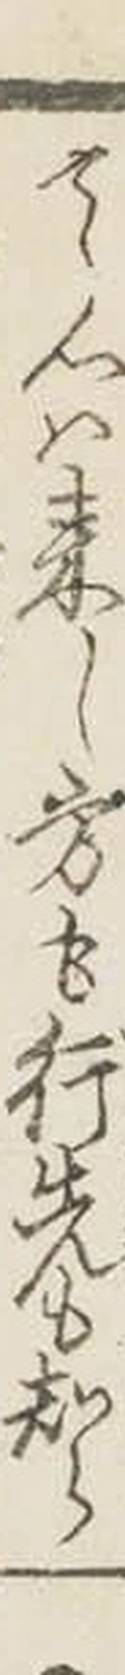て心は来し方も行先も知ら
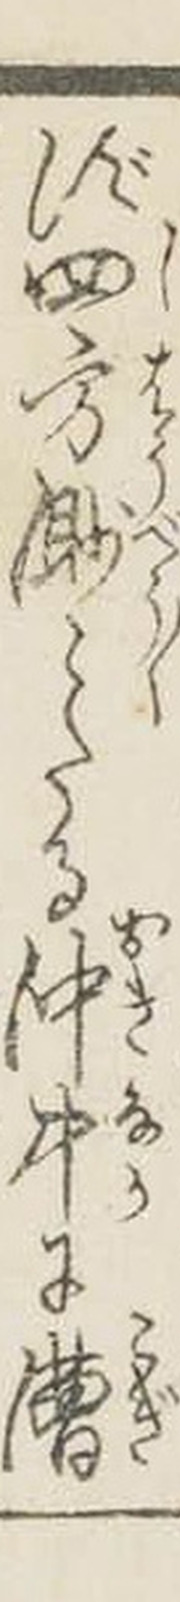ず四方渺々たる沖中に漕
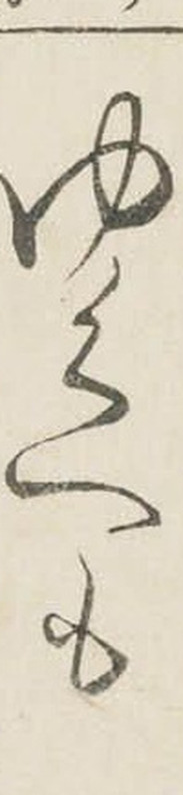ゆくへも
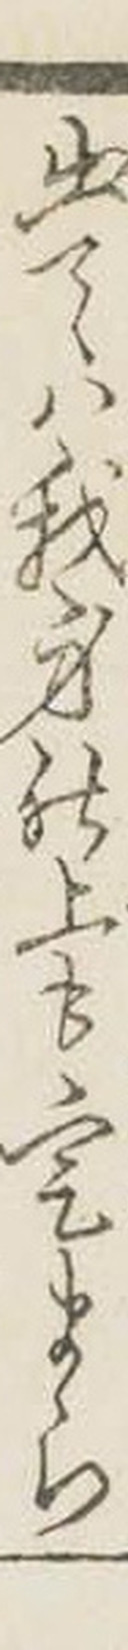出ては我身の上も定まら
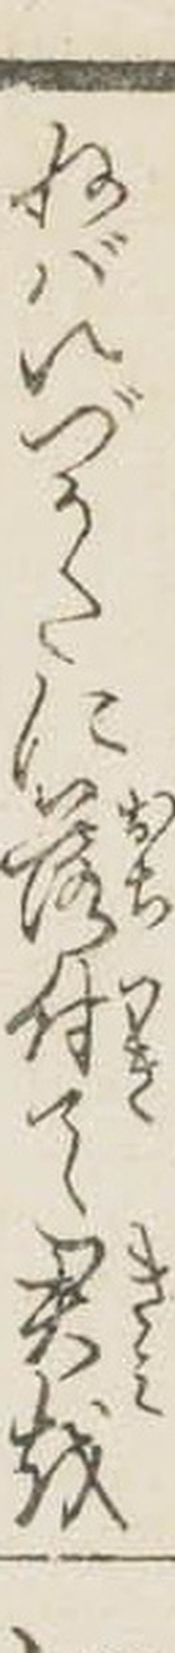ねばいづかたに落付て君を
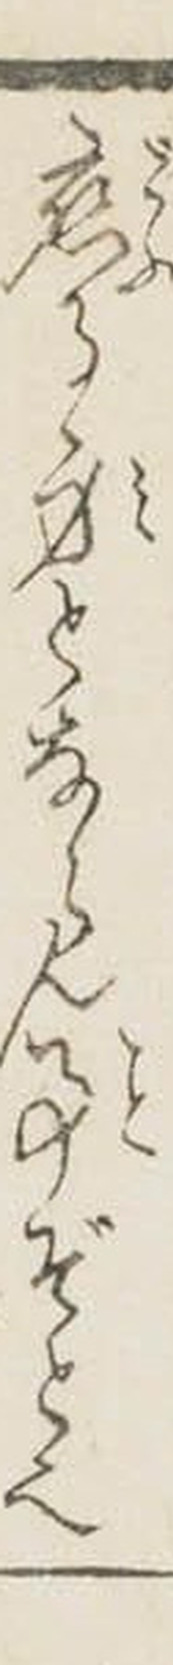恋る身とならん事ぞと也
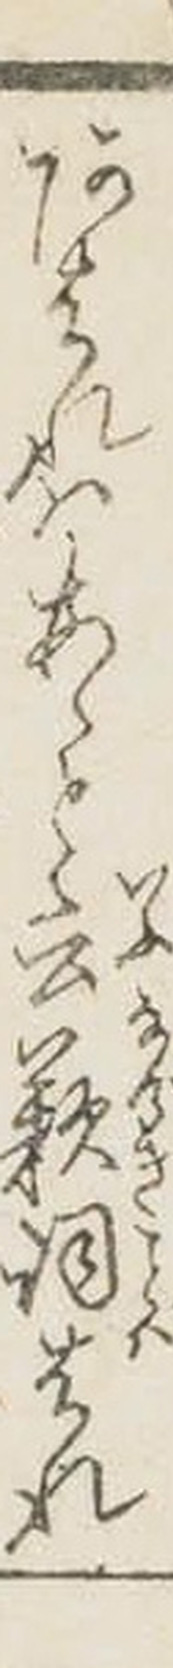あはれはあゝと云歎詞はれ
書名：源氏百人一首
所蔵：東京学芸大学教育コンテンツアーカイブ
